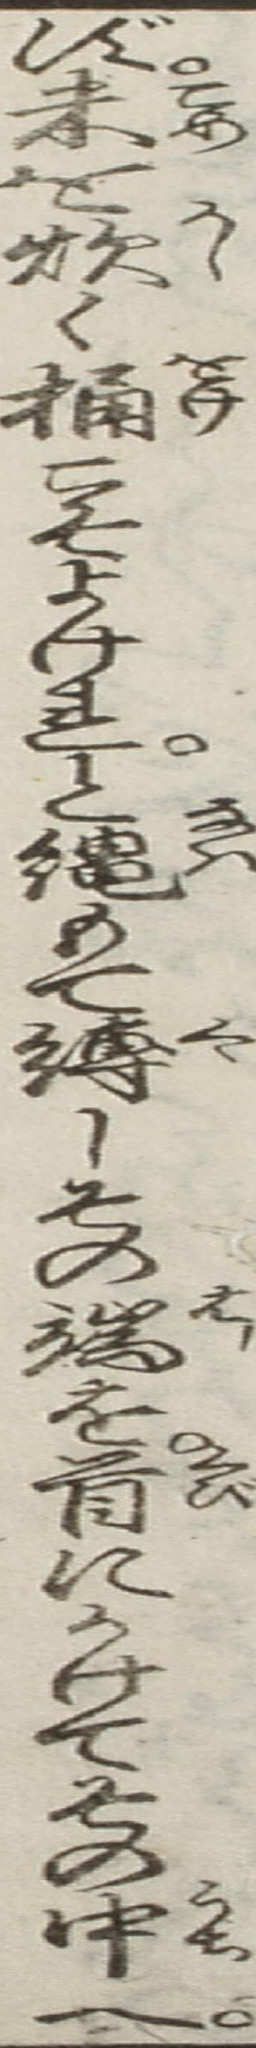ず。米を炊く桶こそよけれ。と縄もて縛しその端を。首にかけてその中へ。
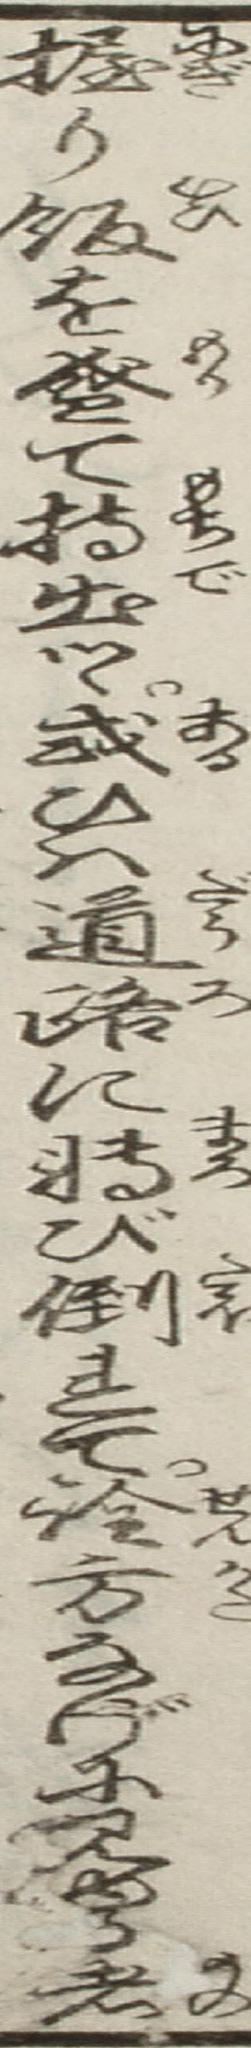握り飯を盛て持出つゝ。或ひは道路に轉び倒れて。詮方なげに見ゆる者
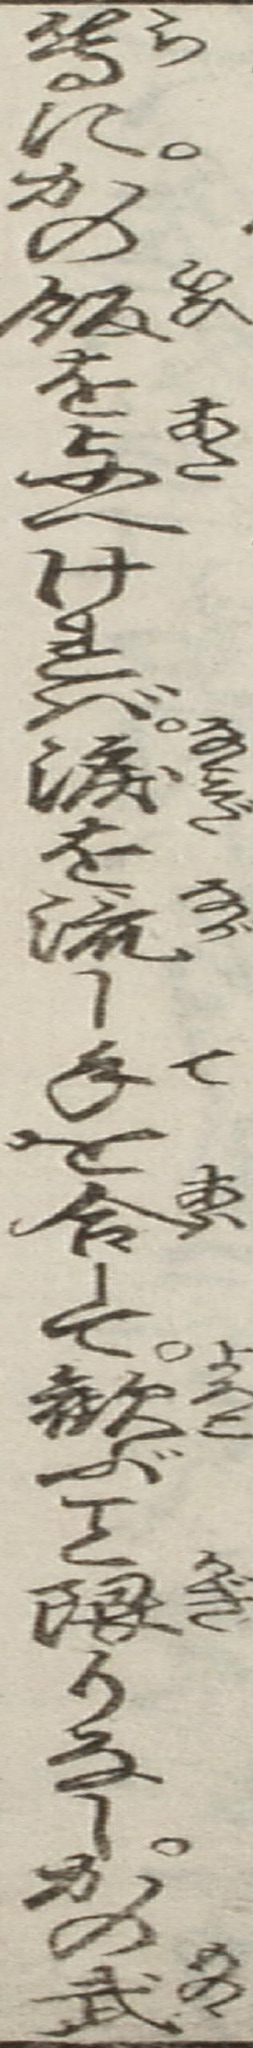等に。かの飯を与へければ。涙を流し手を合して。歓ぶこと限りなし。かの武
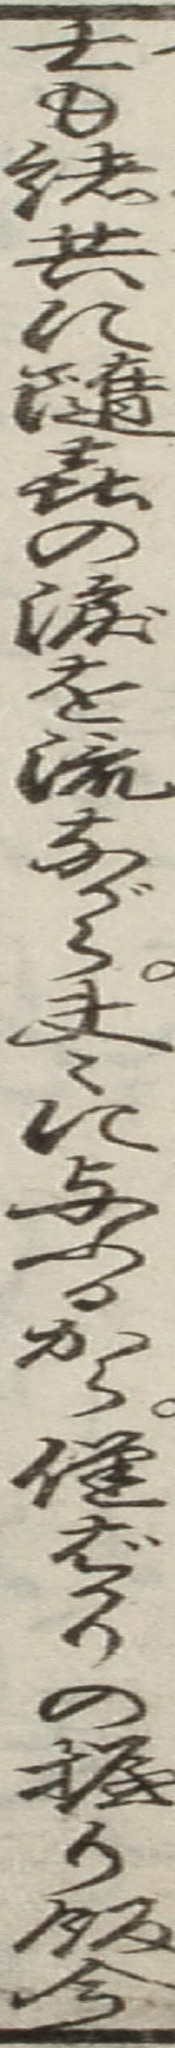士も諸共に随喜の涙を流ながら。夫〻に与ふるから。僅ばかりの握り飯。今
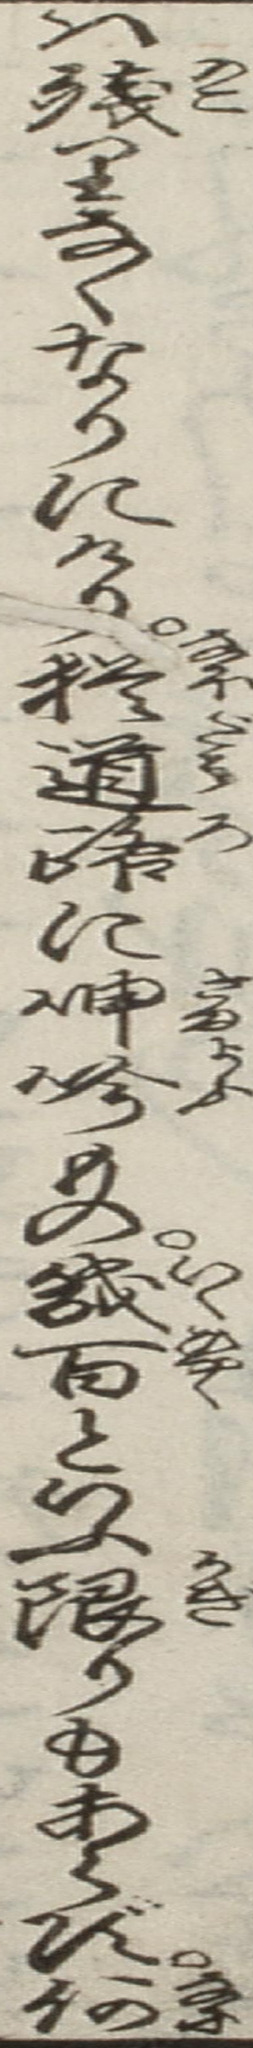は残りなくなりにけり。猶道路に呻吟もの。幾百といふ限りもあらず。何
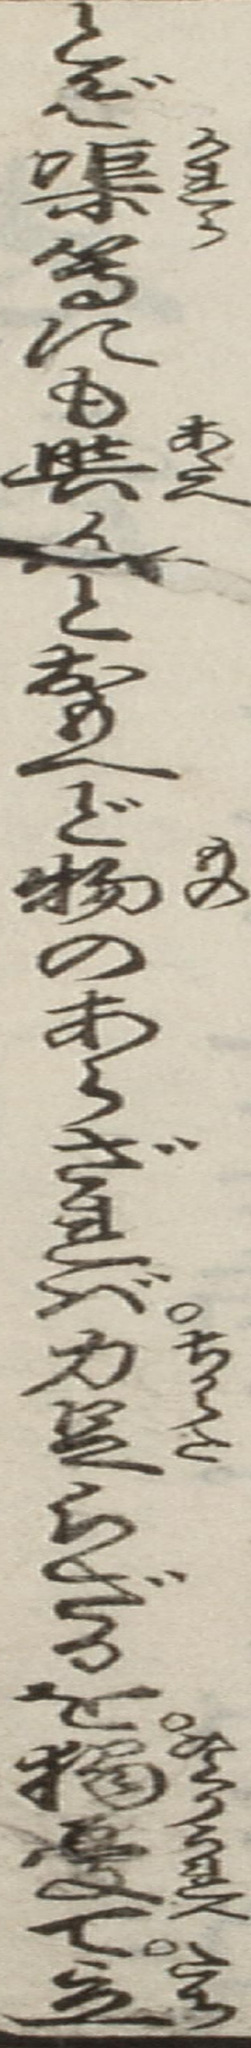とぞ渠等にも與んとおもへど物のあらざれば。力足らざるを。獨憂て。立
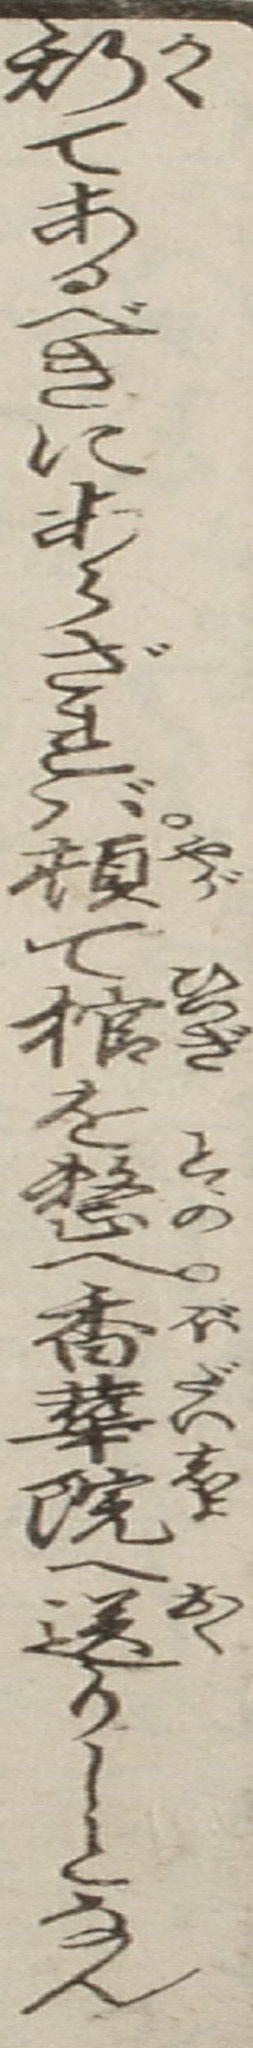斯てあるべきにあらざれば。頓て棺を整へ。香華院へ送りしとなん
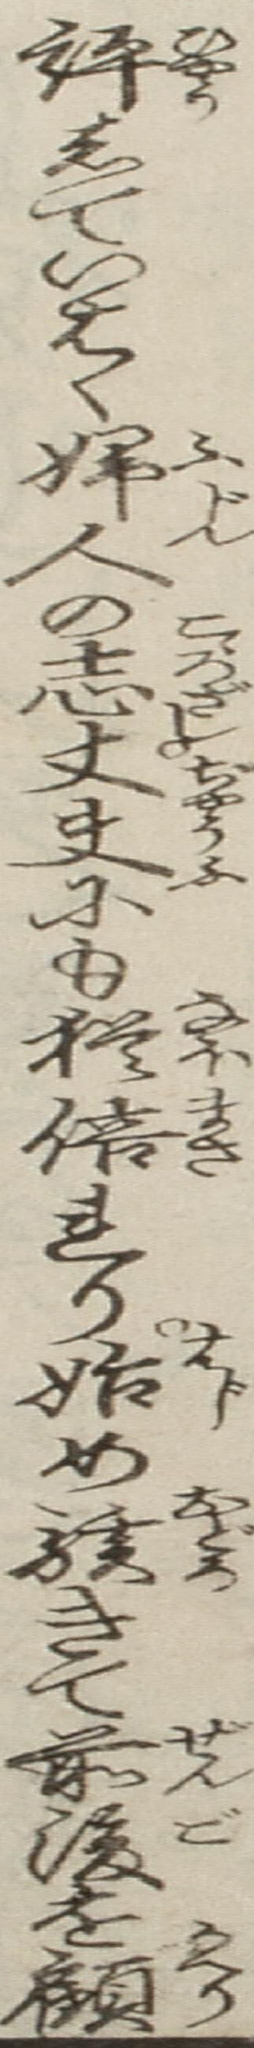評していはく婦人の志。丈夫にも猶倍れり。始め駭きて前後を顧
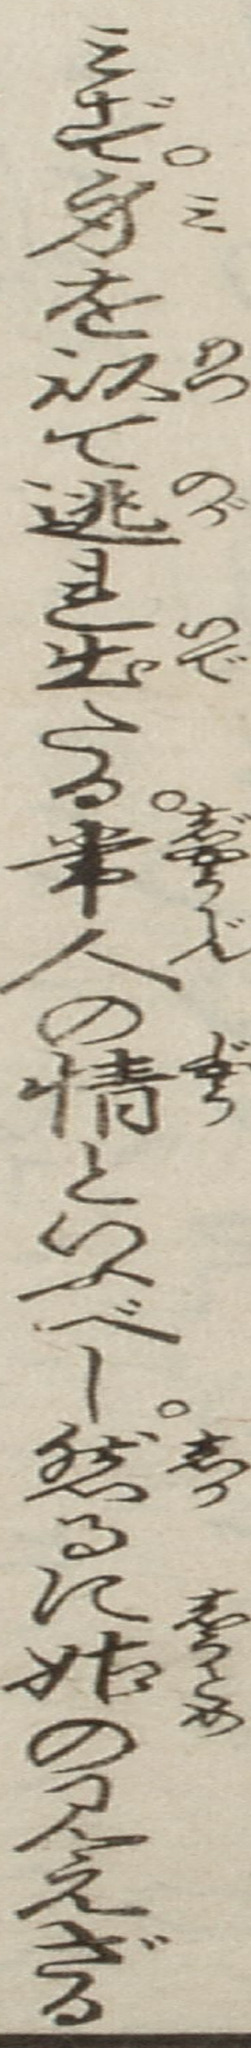みず。身を以て逃れ出たる。常人の情といふべし。然るに姑の見えざる
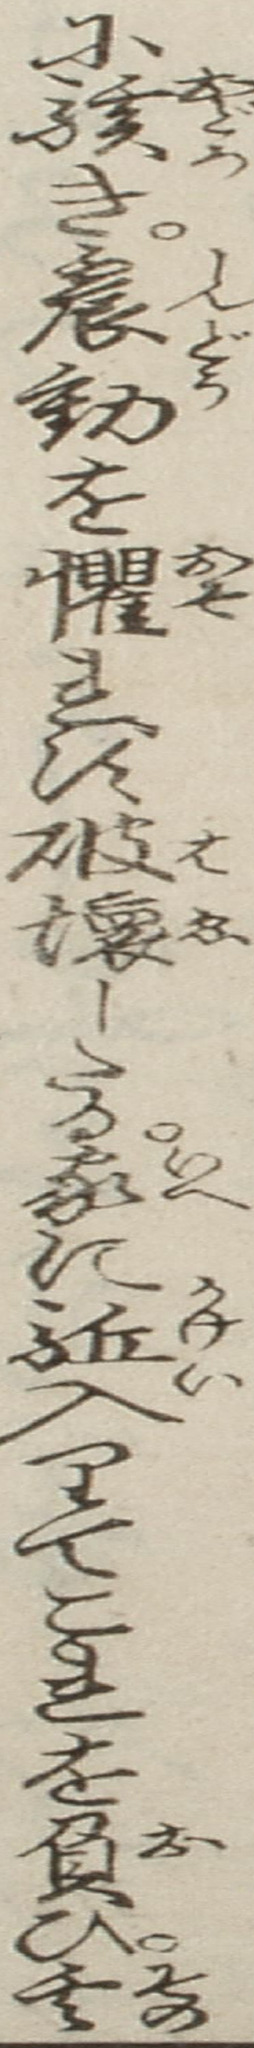に駭き。震動を懼れず破壊したる。家に駈入りてこれを負ひ。其
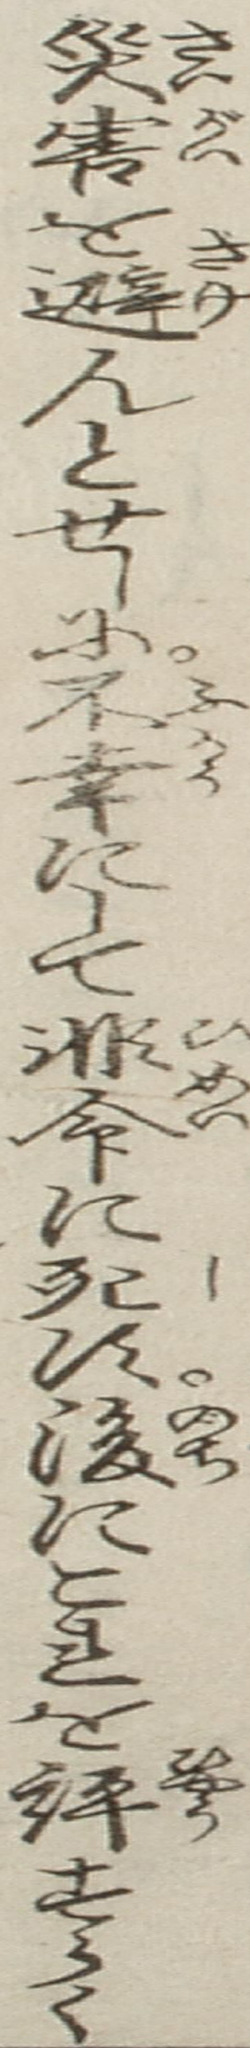災害を避んとせしに。不幸にして非命に死す。後にこれを評すらく
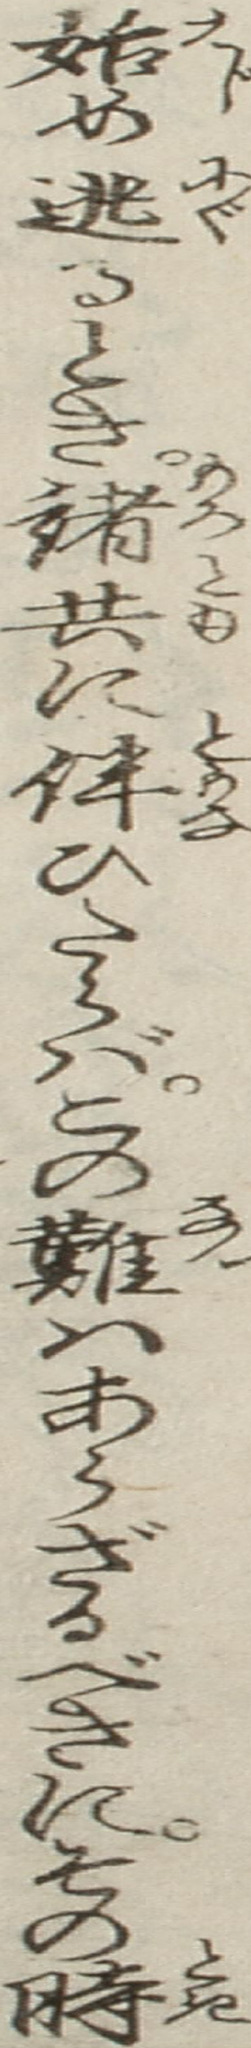始め逃るとき。諸共に伴ひたらば。この難はあらざるべきに。その時
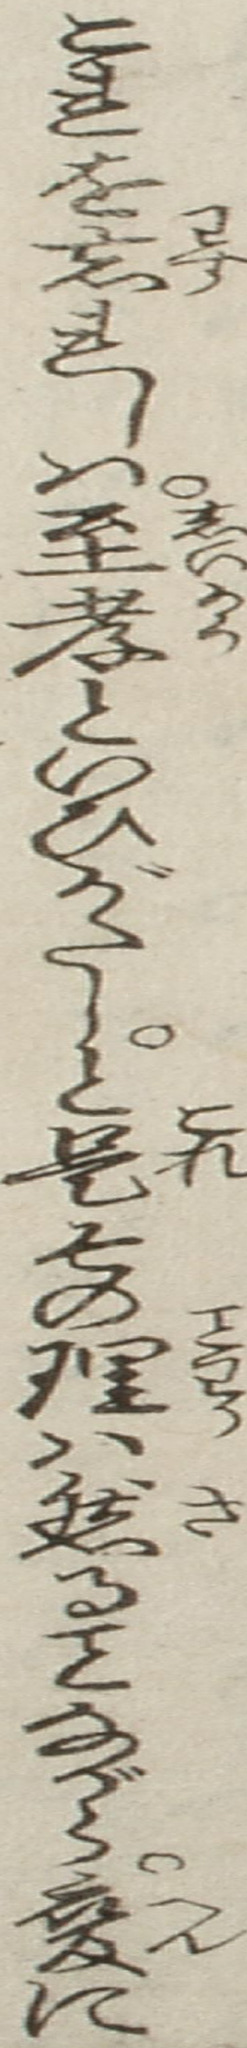これを忘れしは。至孝といひがたし。と是その理は然ることながら。変に
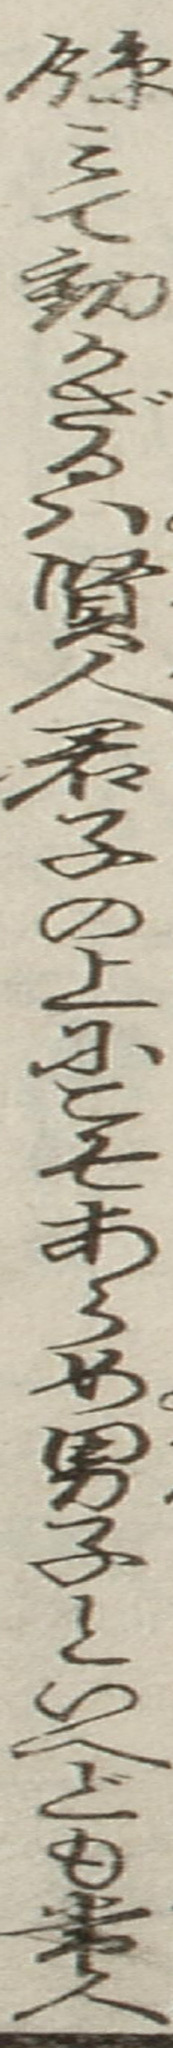臨みて動かざるは。賢人君子の上にこそあらめ。男子といへども常人
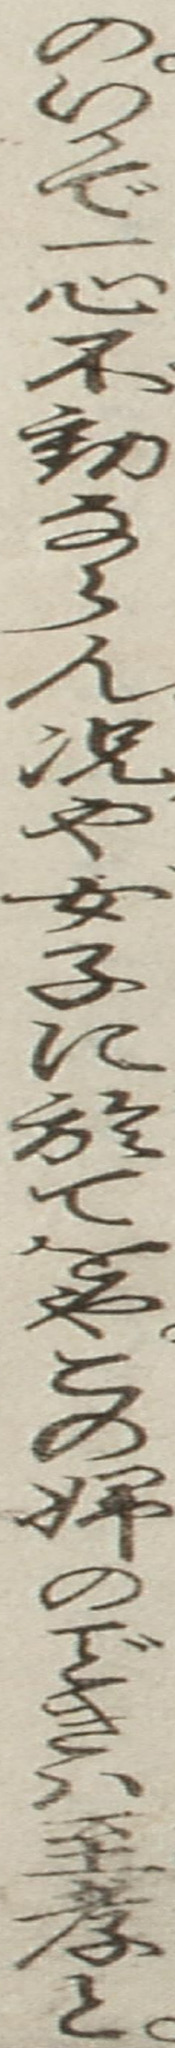の。いかで一心不動ならん。況や女子に於てをや。この婦のごときは至孝と。
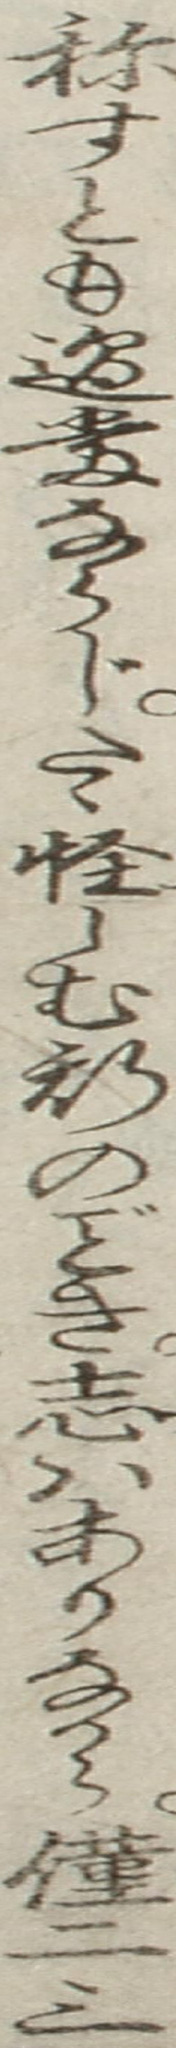称すとも過當ならじ。たゝ怪しむ斯のごとき。志はありながら。僅ニ三
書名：安政見聞録　上
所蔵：東京大学地震研究所図書室 Earthquake Research Institute Library, The University of Tokyo, JAPAN
